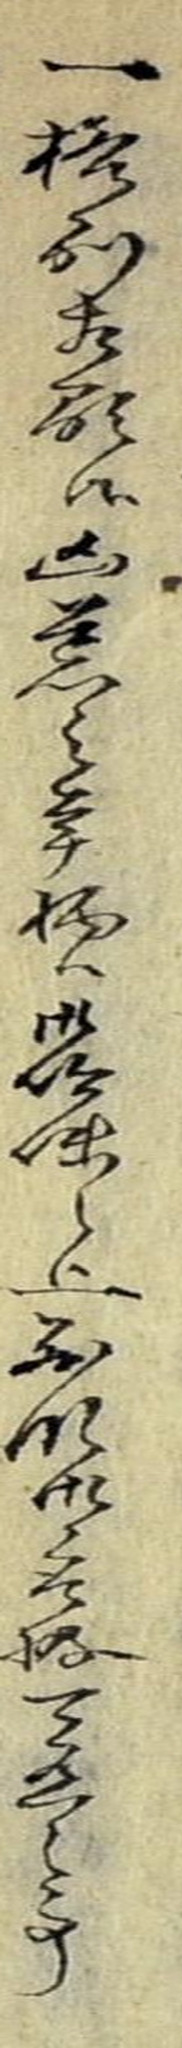一格別相願候凶荒之年柄は御吟味之上別段御取扱可有之事
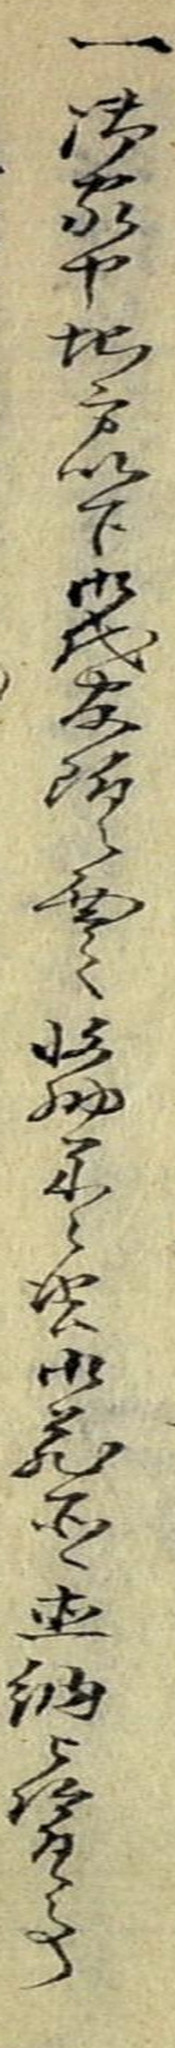一御家中地方以下御代官附之面々収納米之儀御蔵所へ直納被仰付候事
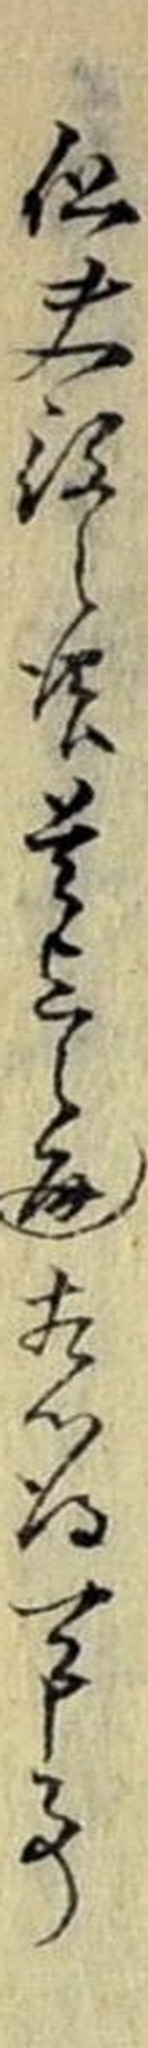但夫役之儀は是迄之通相心得可申事
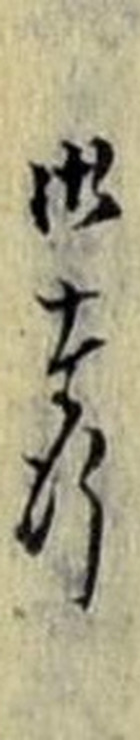御奉行
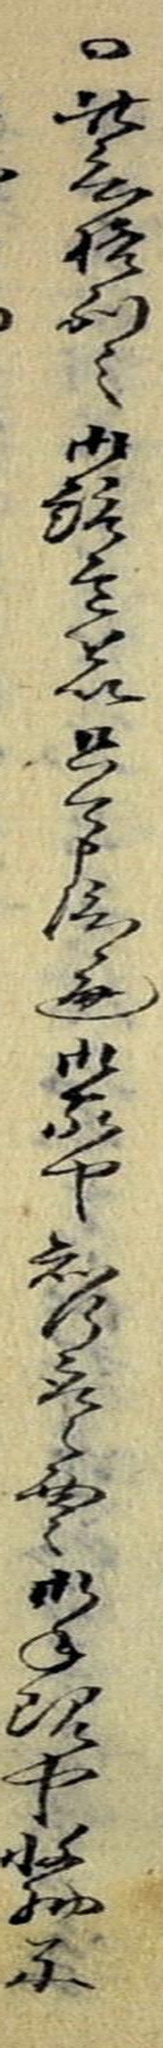○此度格別之御趣意を以只今申渡候通御家中知行取之面々御年限中収納米
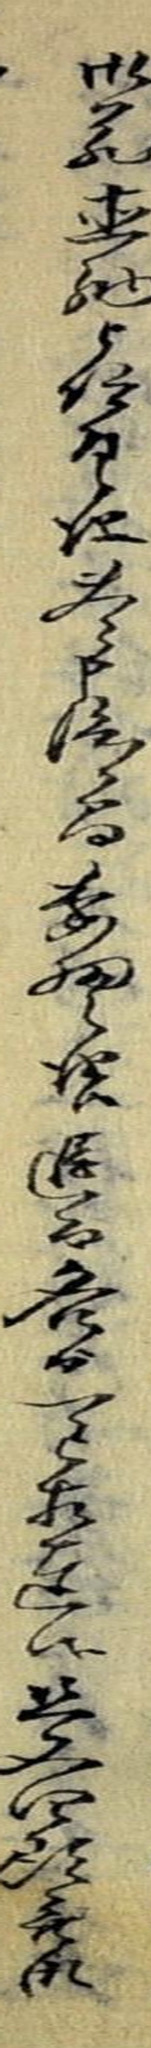御蔵直納被仰付候儀夫々申渡候間委細之儀は追而各ゟ可被相達候且又四郡并御
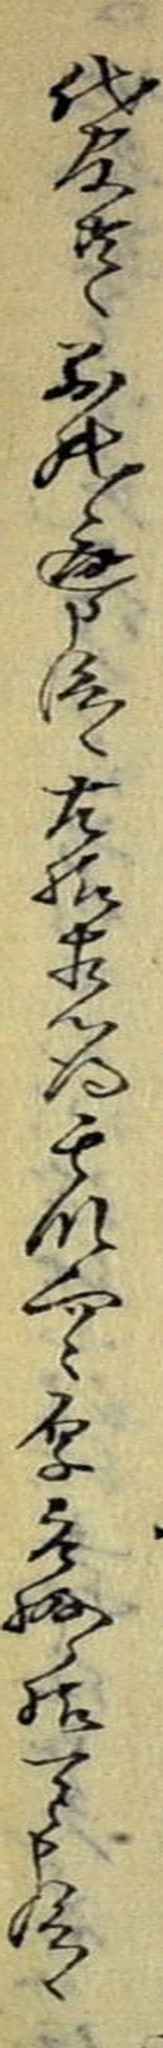代官共へ別紙之通申渡候左様相心得其段向々厚取扱候様可被申渡候
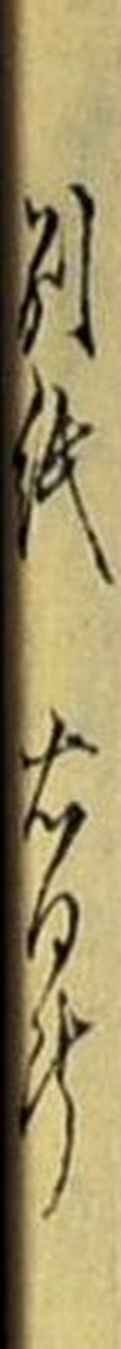別紙右同断
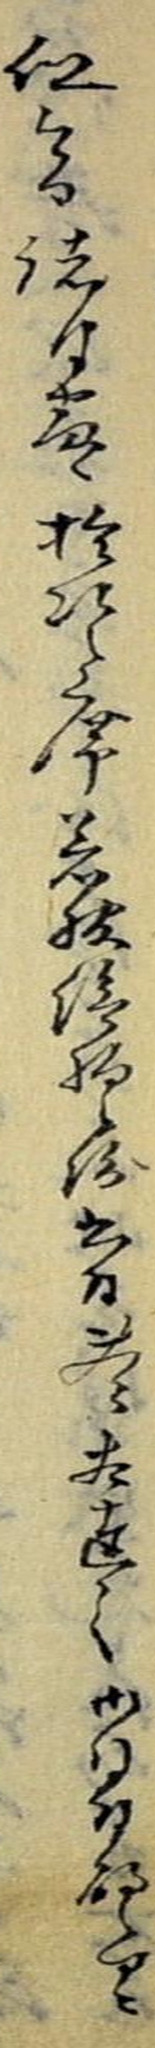但今日諸月番へ於次之席着服倹約之儀書付夫々相達之御目付触之部に
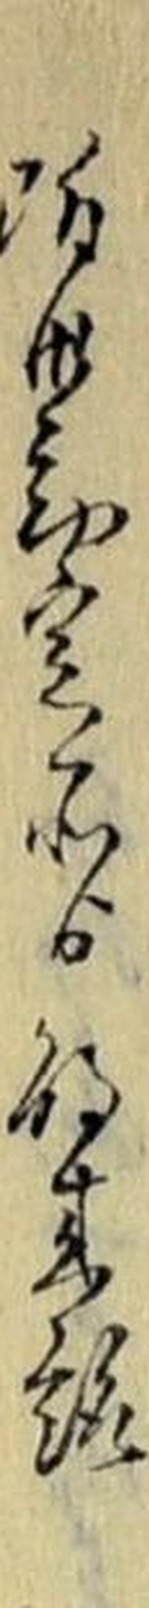附御勘定所ゟ触来趣
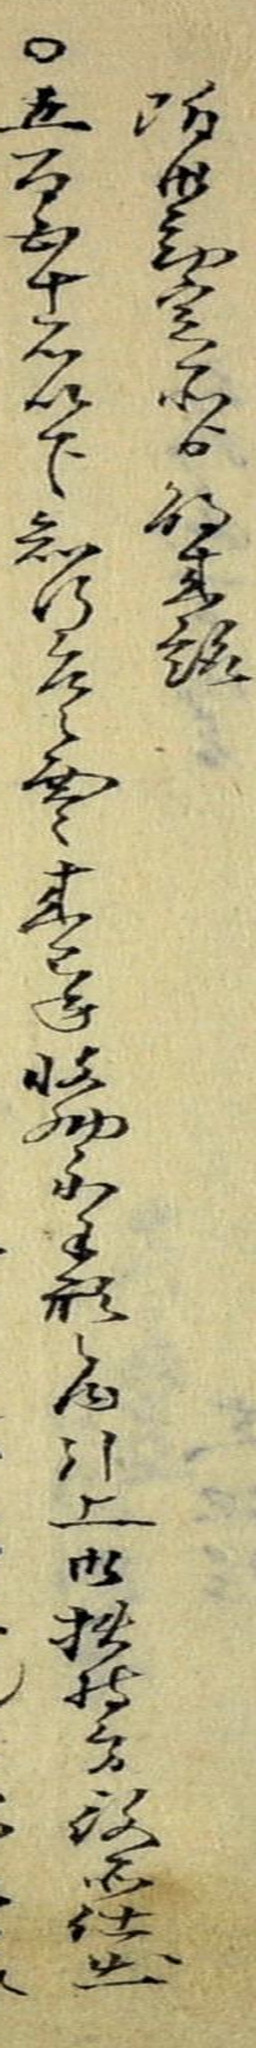○五百五十石以下知行取之面々来巳年収納米手形之内引上御扶持方役所仕出
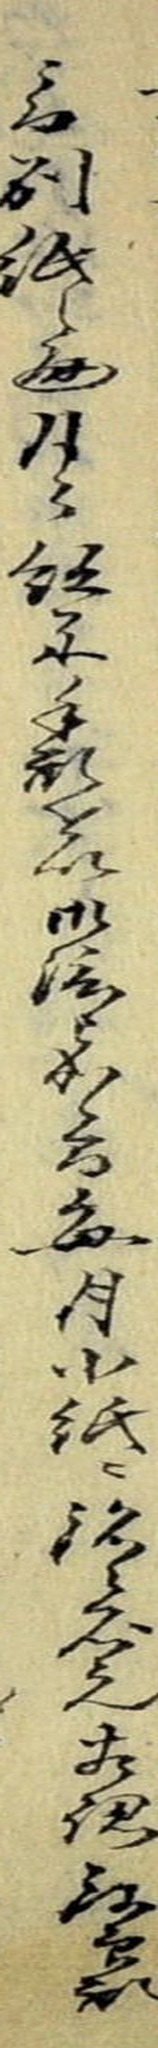に而別紙之通月々賄米手形を以御渡被成候間毎月小紙に銘々名元相認致印形
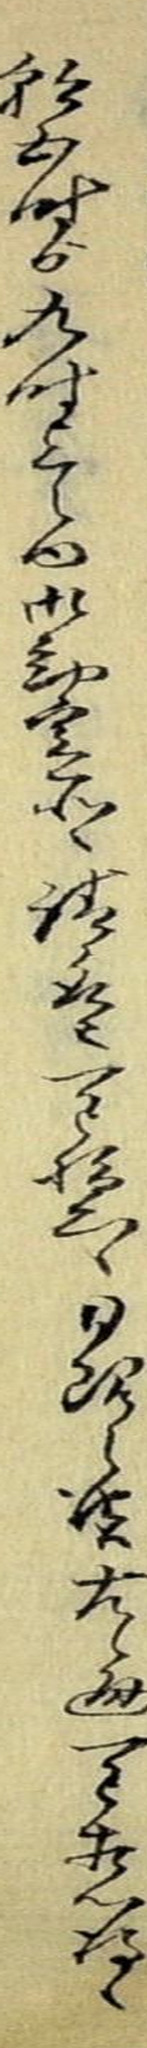朝五時ゟ九時迄之内御勘定所へ請取に可被指出候日限之儀は左之通可被相心得候
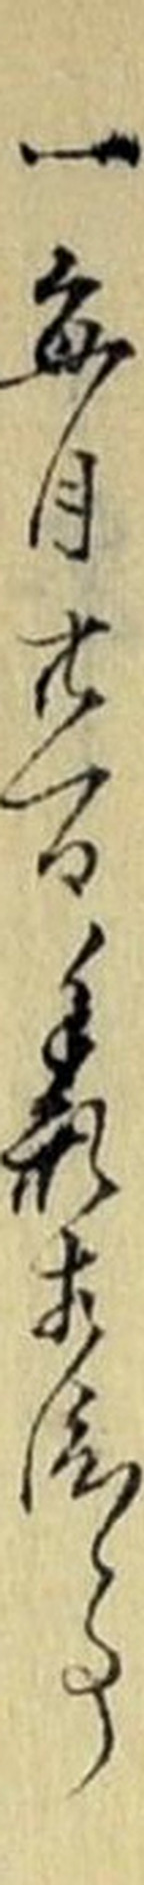一毎月廿一日手形相渡候事
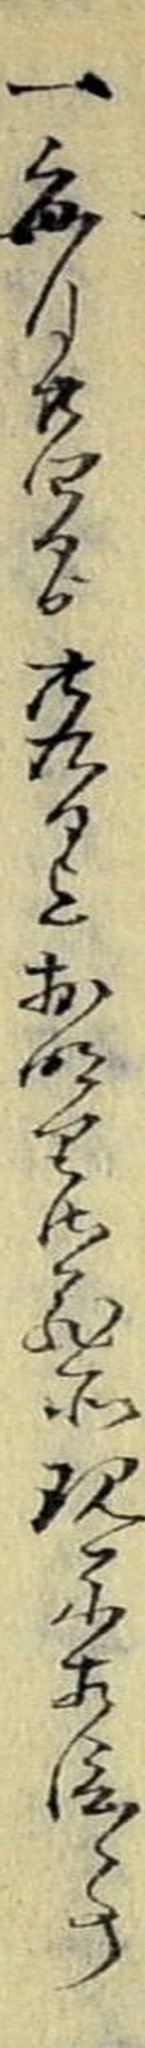一毎月廿四日ゟ廿九日迄於明里御蔵所現米相渡候事
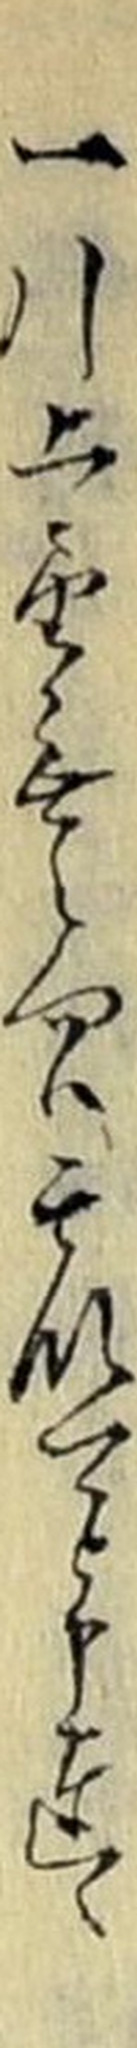一引上望無之向は其段可被申達候
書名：命令之部 六
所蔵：福井県文書館 Fukui Prefectural Archives
